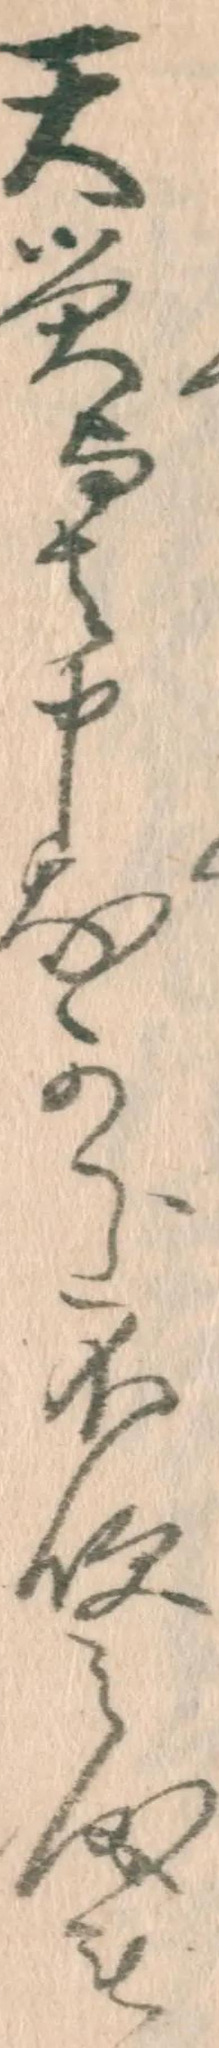天災とは申なから不便之儀も
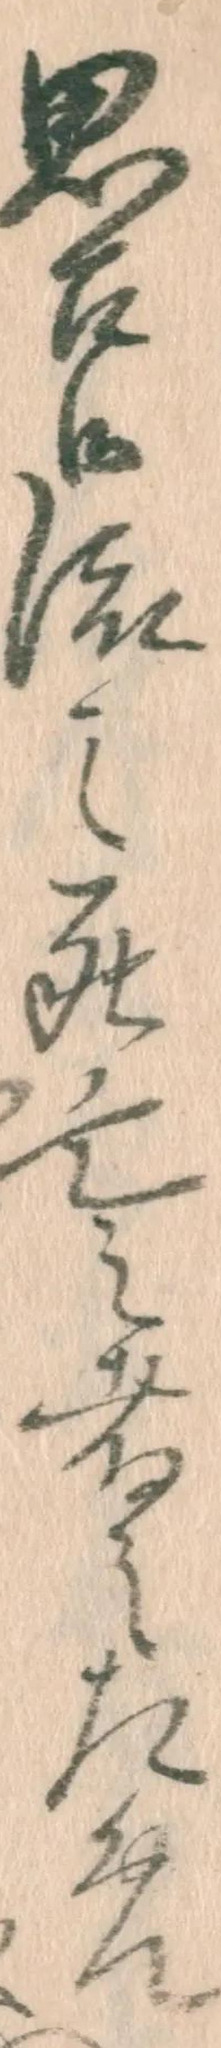思召候依之死亡之者之ため
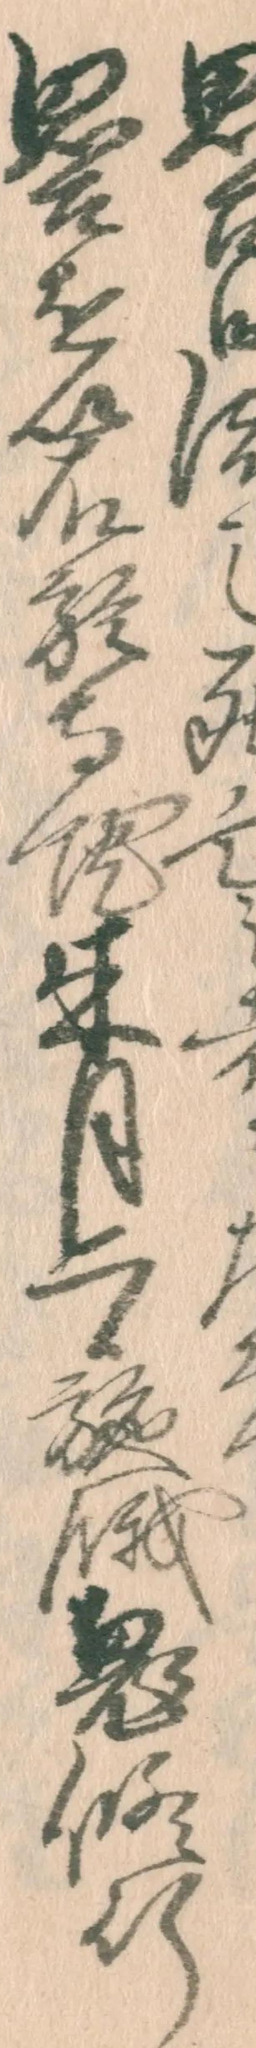思召を以右於寺院来月二日施餓鬼修行
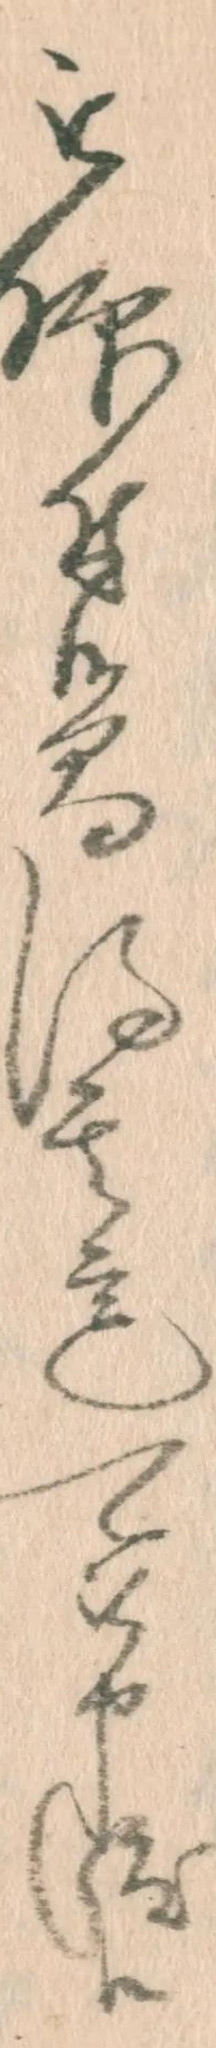被仰付候間得其意可被申渡候
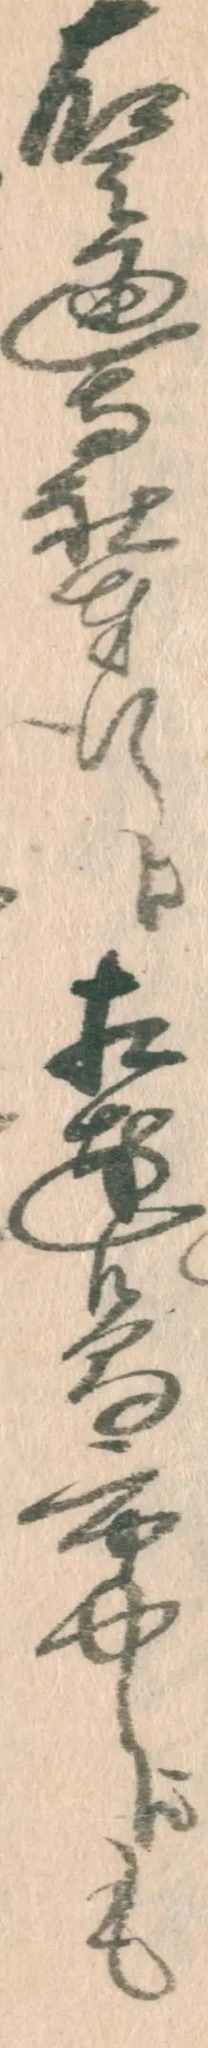右之通寺社奉行え相達候間市中えも
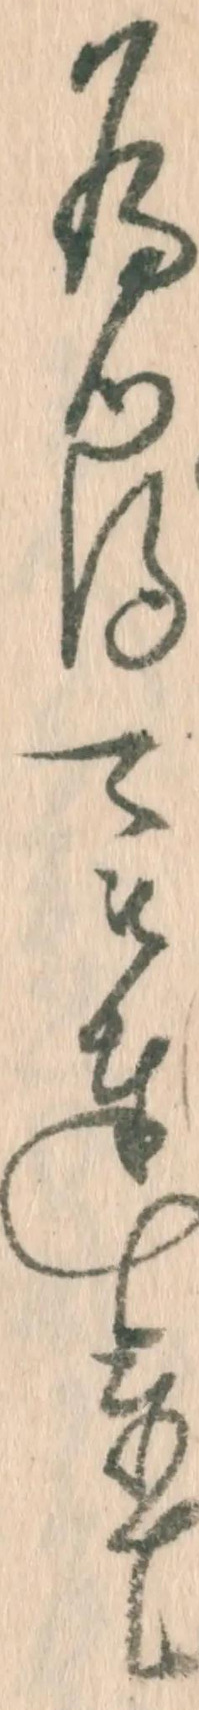為心得可被達置候

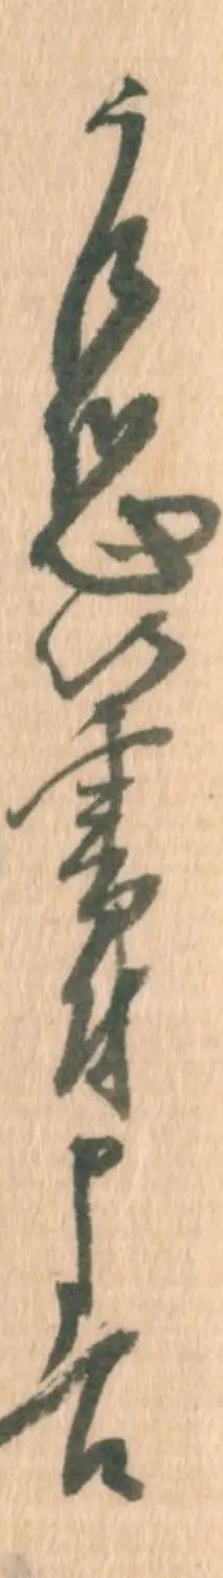乍恐以書付申上候
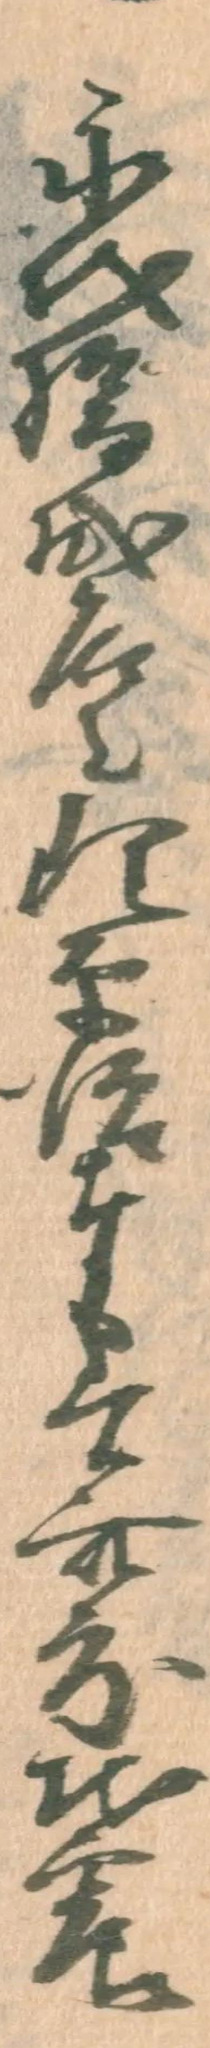一永代橋掛名主理平治奉申上候此度地震
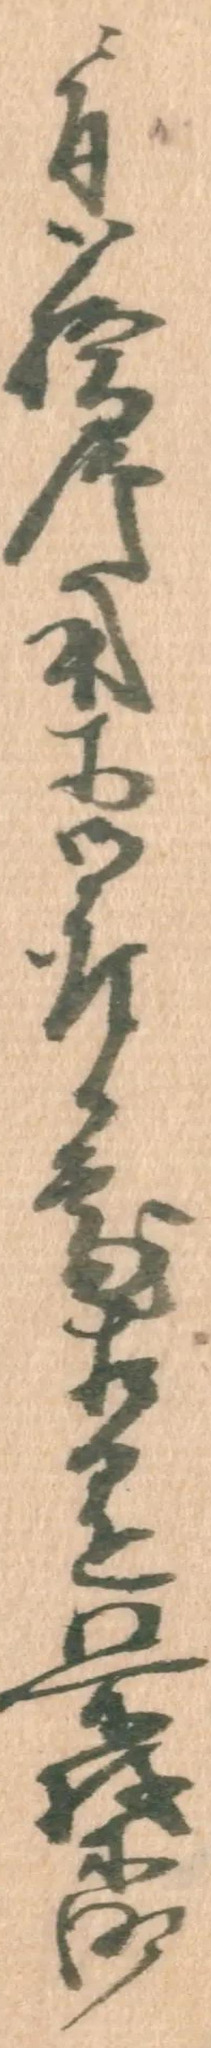ニ付御橋御用等御座候処相懸同所材木町
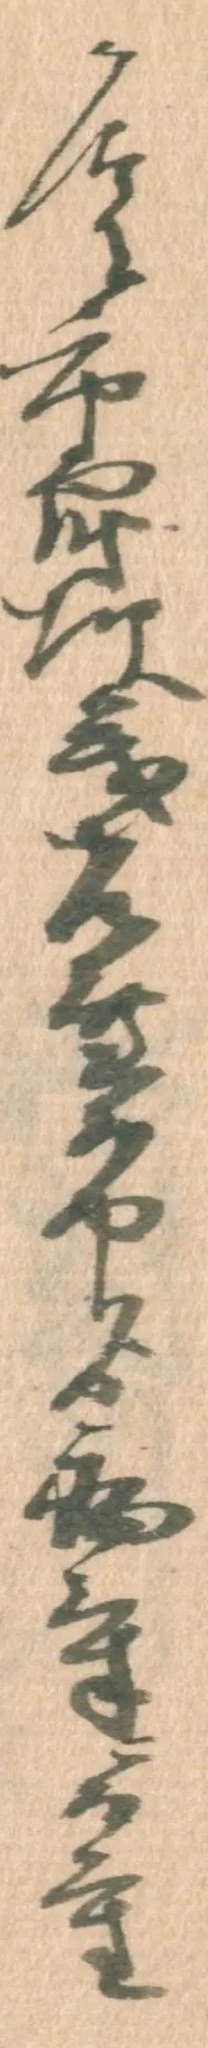名主市郎次義先達而中ゟ病気ニ而重
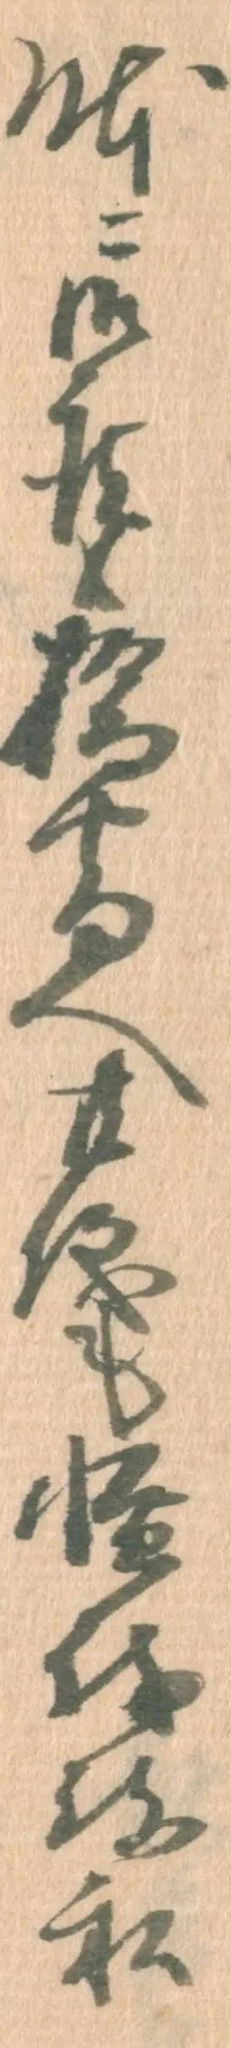躰ニ御座候橋番人共儀も怪我致私
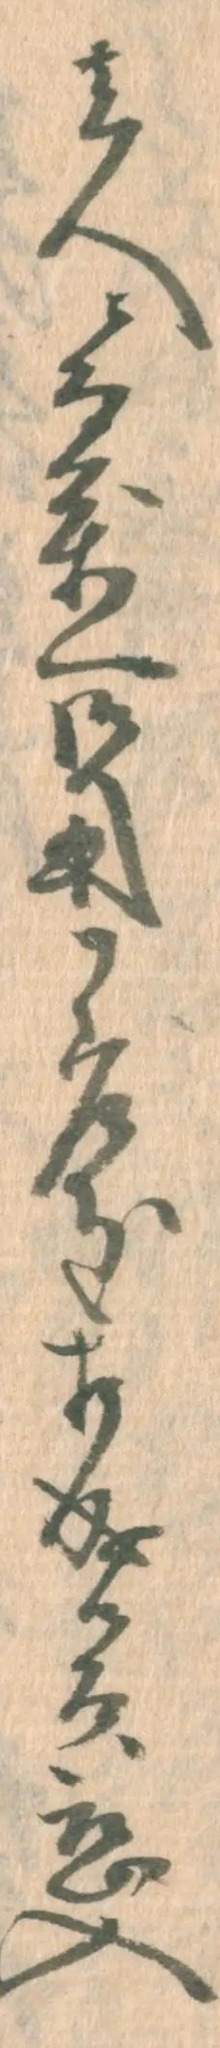壱人ニ而万一御用の差支相成候而は恐入
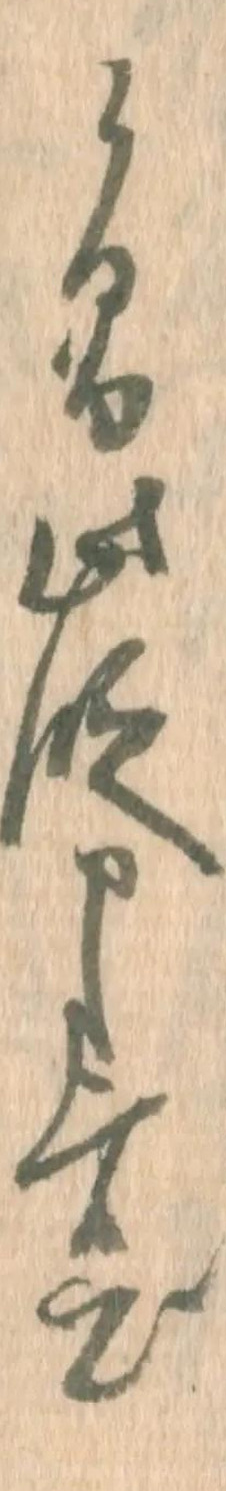候間此段申上候以上

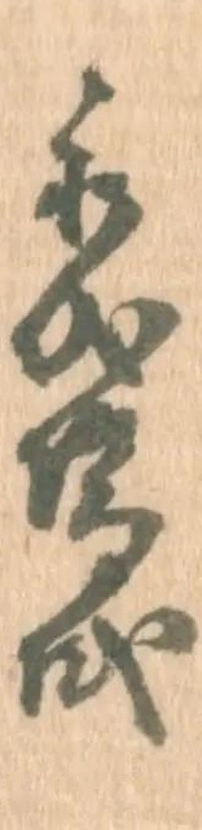永代橋掛
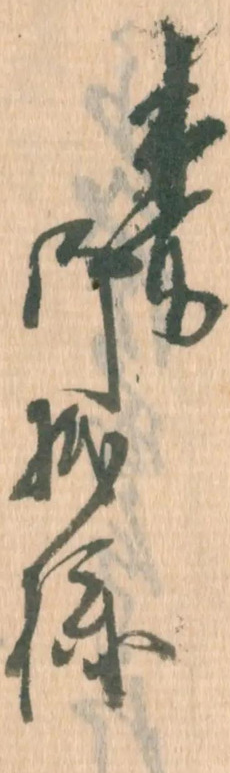御掛様
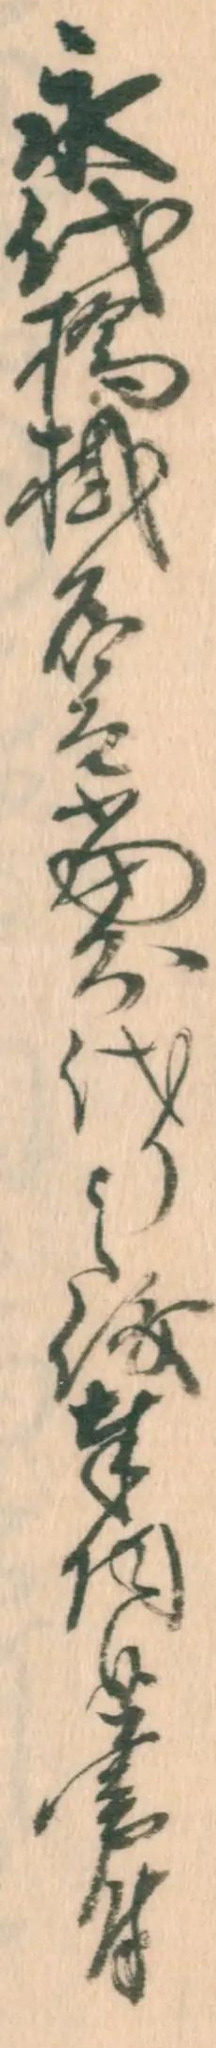永代橋掛名主当分代り之儀奉伺候書付
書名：地震災書留 2巻. [1] 内表紙に「地震災書留　安政二卯年　但本所深川御用屋敷地代免除調」とあり
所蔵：国立国会図書館 National Diet Library, JAPAN
